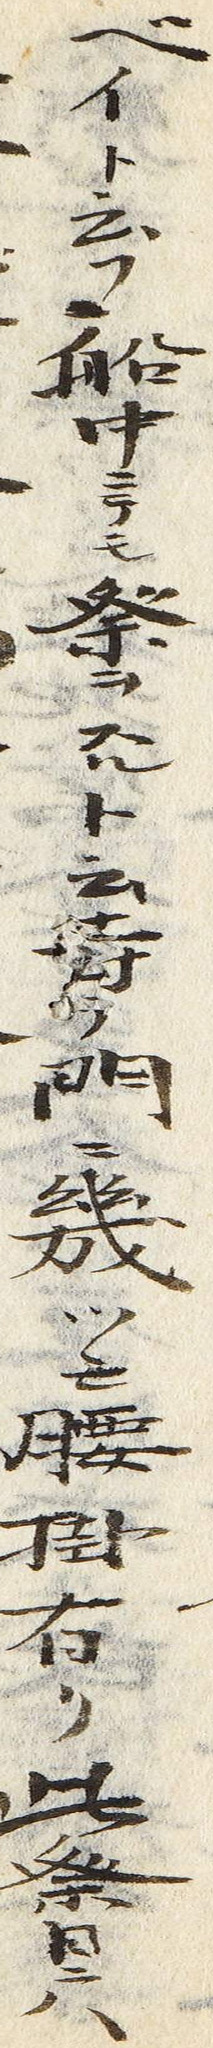ベイト云フ船中ニテモ祭ヲスルト云寺ノ門ニ幾ツモ腰掛有リ此祭日ニハ
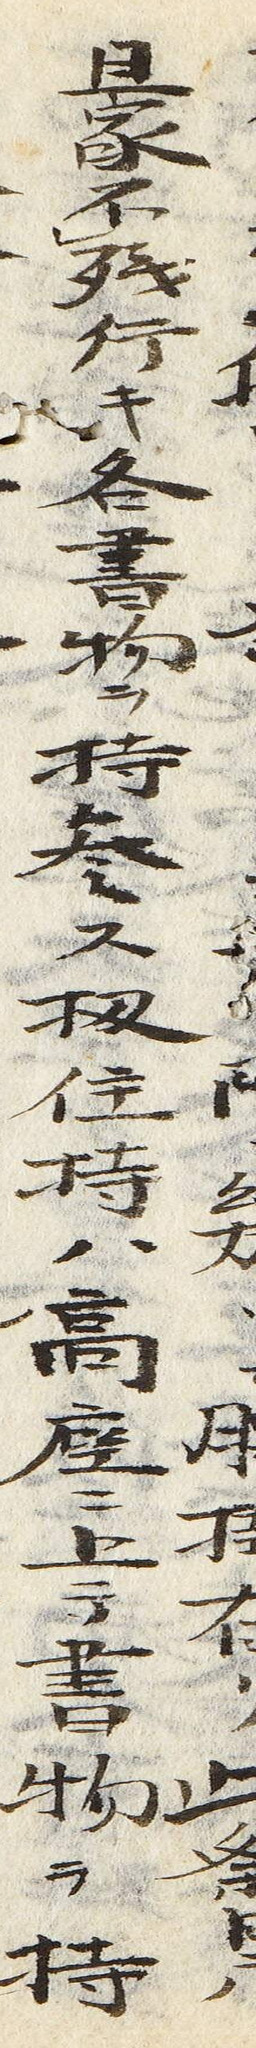旦家不残行キ各書物ヲ持参ス扨住持ハ高座ニ上テ書物ヲ持
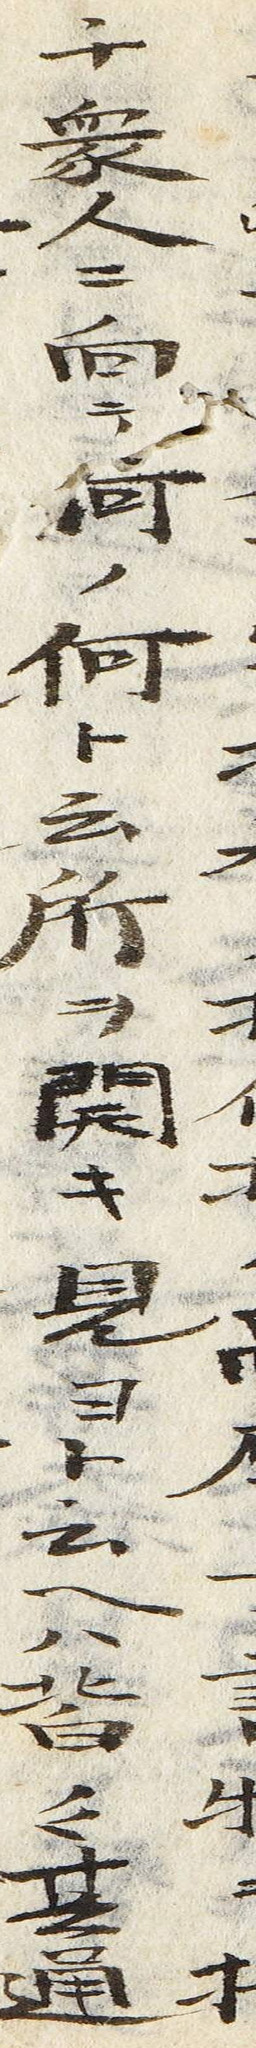チ衆人ニ向キ何ノ何ト云所ヲ開キ見ヨト云へハ皆々其通
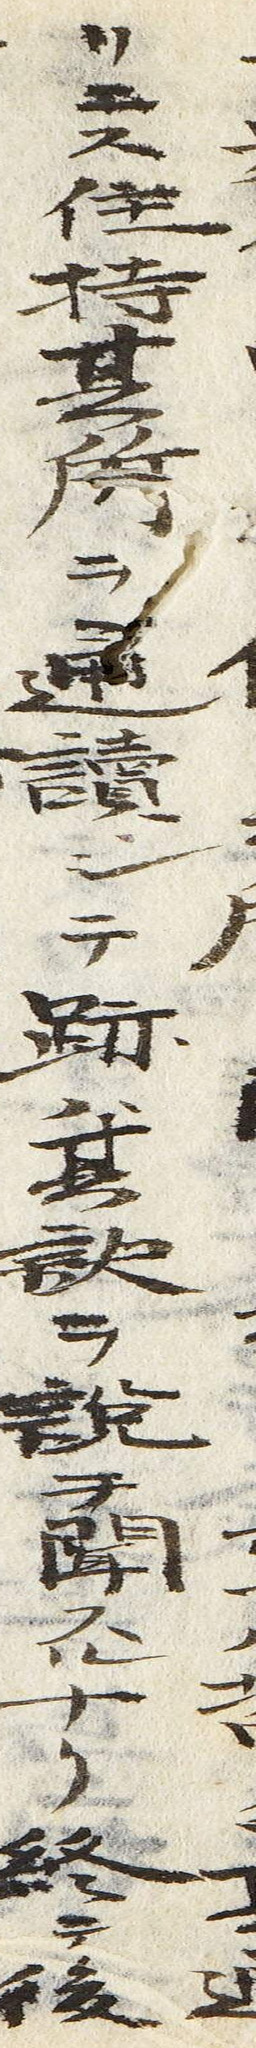リニス住持其所ヲ通読シテ跡ハ其訳ヲ説テ聞スルナリ終テ後
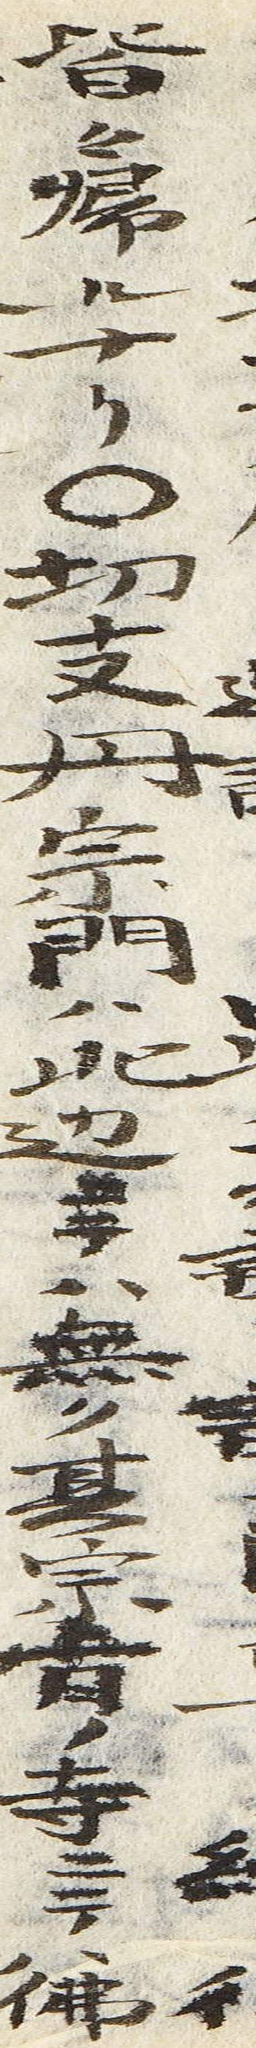皆々帰ルナリ〇切支宗門ハ此辺ニテハ無ク其宗旨ノ寺ニテハ仏
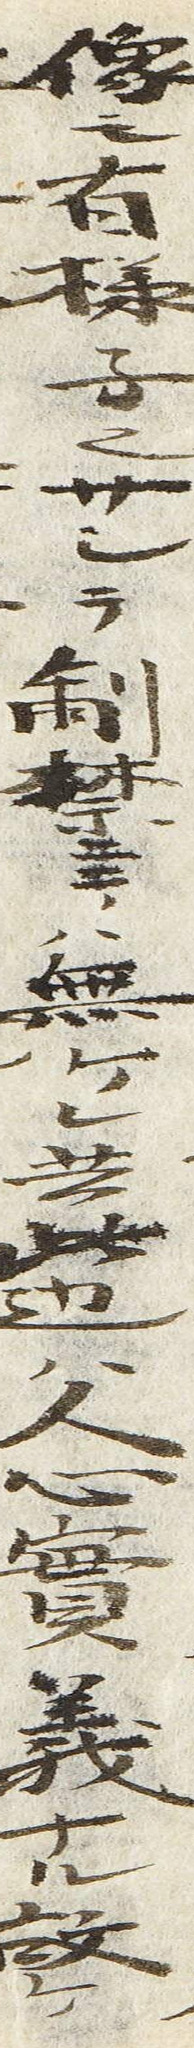像之有様子也サシテ制禁ニテハ無ケレ共此辺ハ人心実義ナル故ケ
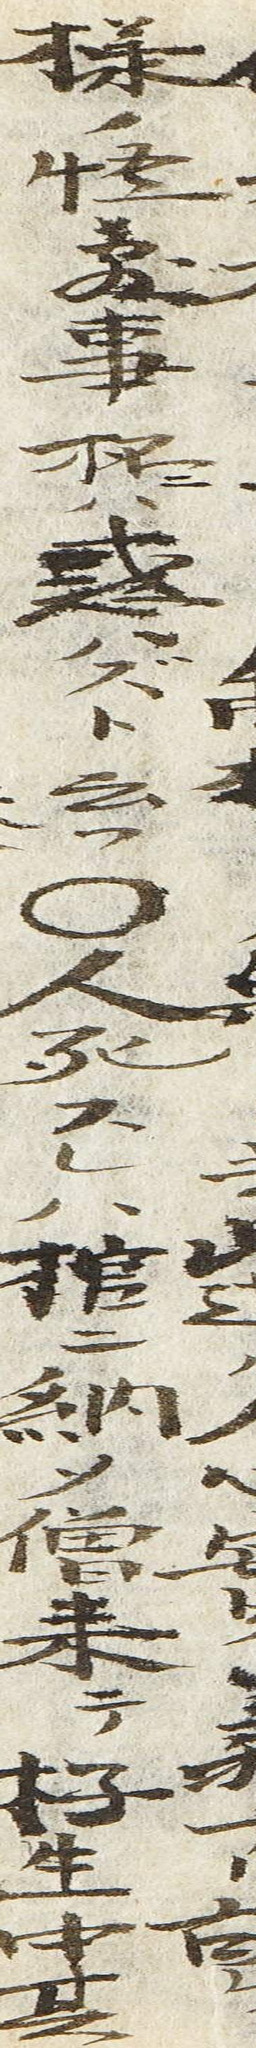様の怪敷事抔ニハ惑はずと云フ〇人死スレハ棺ニ納メ僧来テ生中其
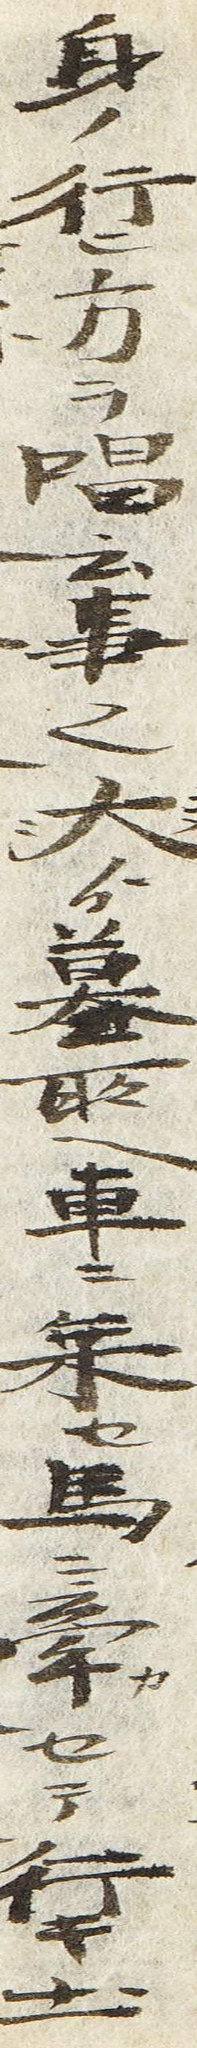身ノ行ヒ方ヲ唱云事也大ゟ墓所ヘ車ニ乗セ馬馬ニ牽カセテ行キ土
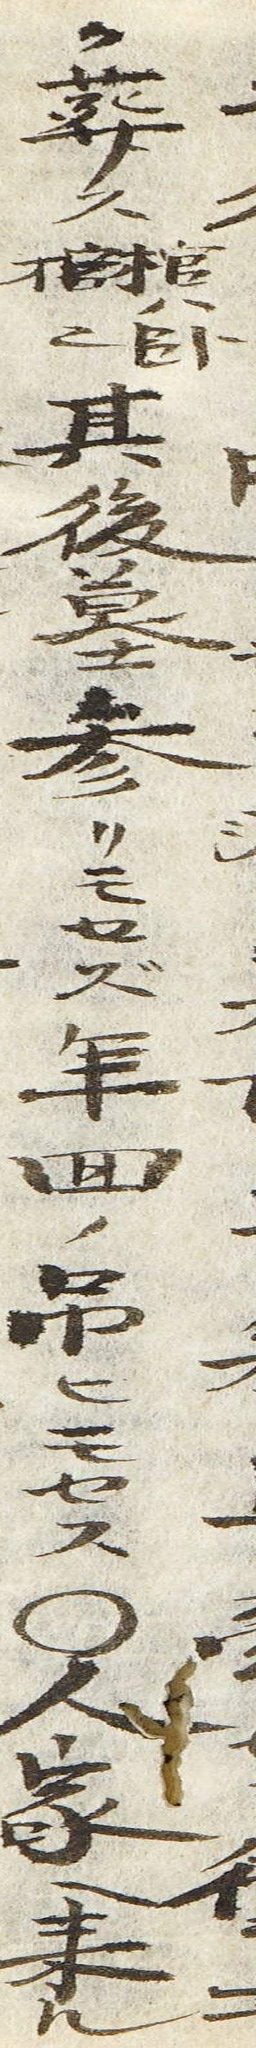カ葬ス棺ハ臥棺也其後墓参リモセズ年回ノ吊ヒモセス〇人家ヘ来ル
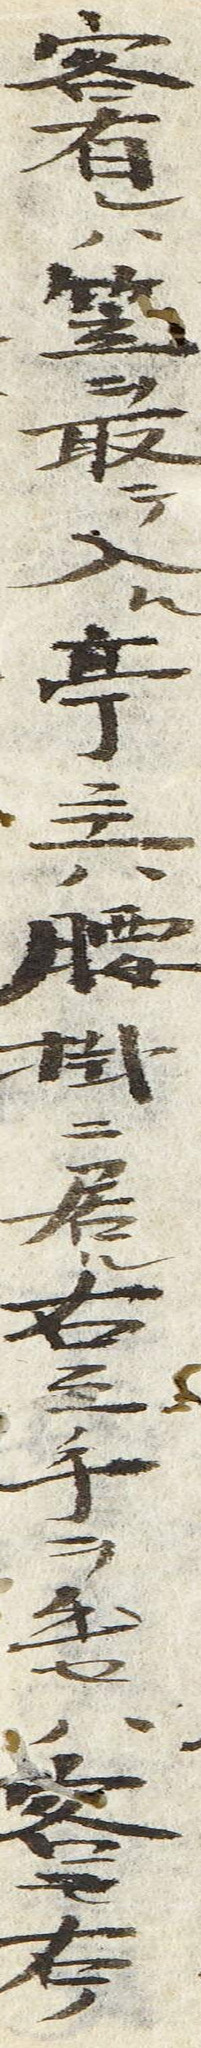客有レハ笠ヲ取テ入ル亭主ハ腰掛ニ居ル右手ヲ出セハ客モ右ノ
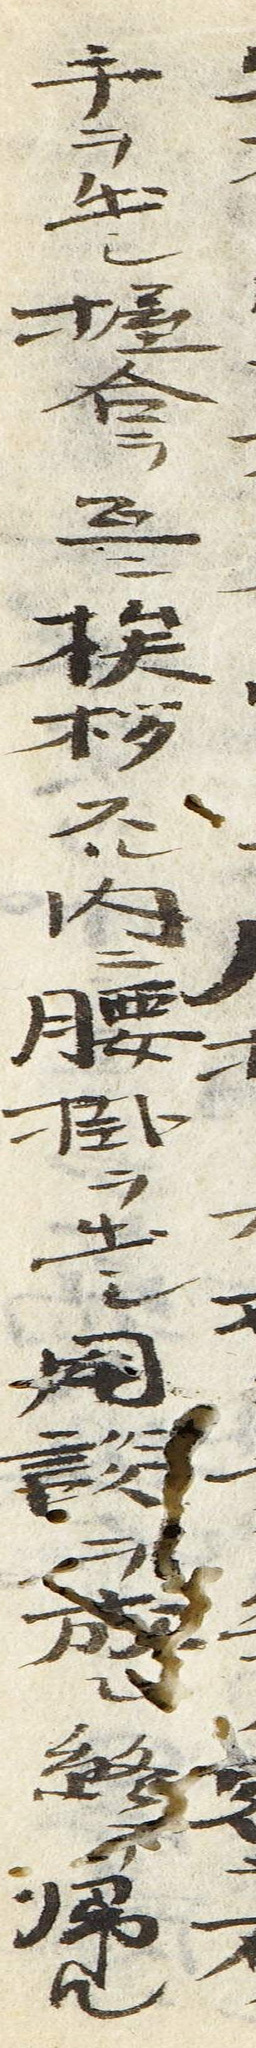手ヲ出シ握合ヲ互ニ挨拶スル内ニ腰掛ヲ出シ用談ヲ成シ終テ帰ル

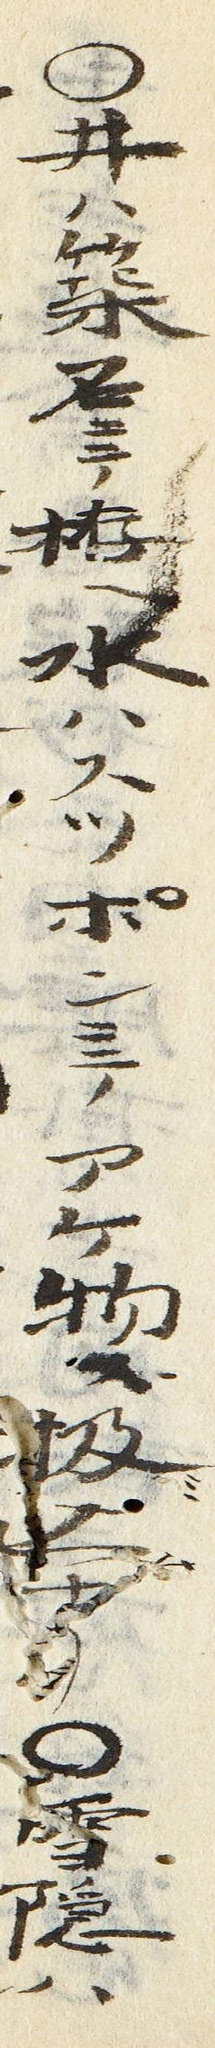〇井ハ築石ニテ拵ヘ水ハスツポンニテアケ物ヘ汲ミ込ムナリ〇雪隠ハ
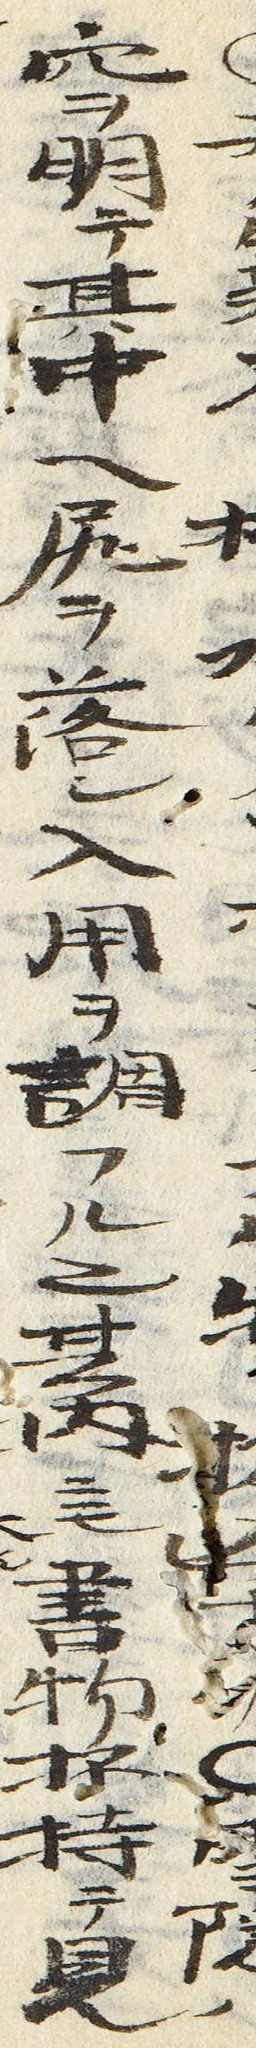穴ヲ明ケ其中ヘ尻ヲ落シ入用ヲ調フル也内ニモ書物抔持テ見
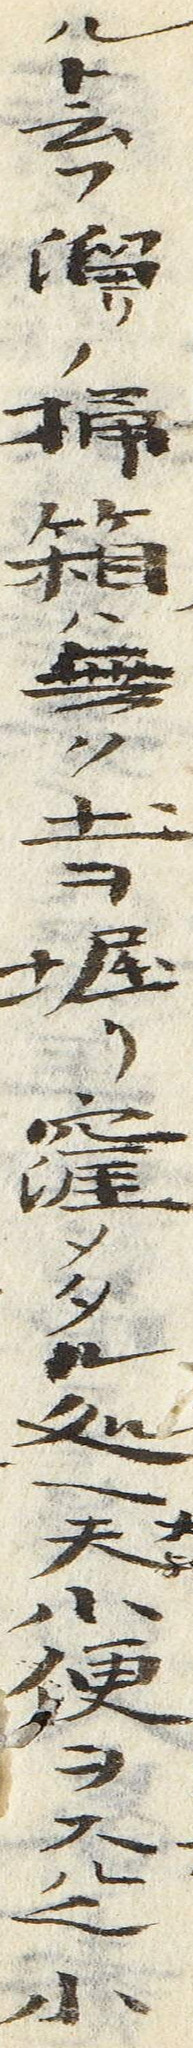ルト云フ溜リノ桶箱無ク土ヲ堀リ窪メタル処ヘ夫小便ヲスル也小
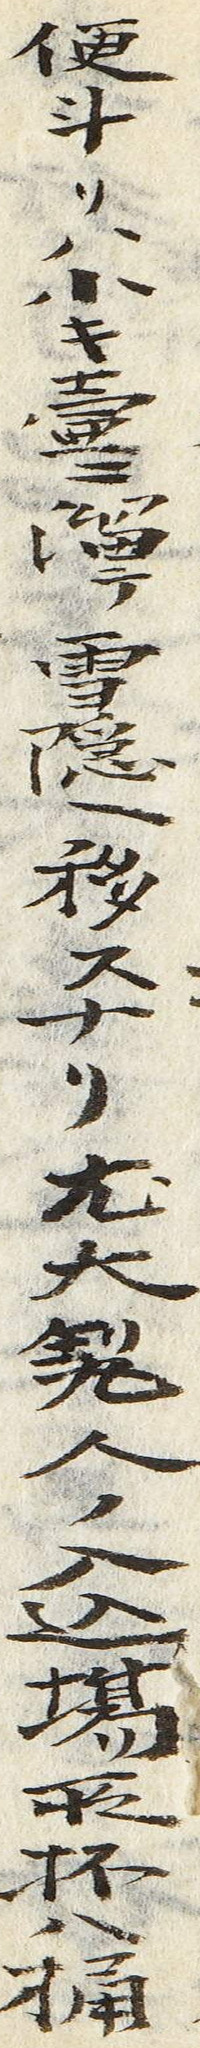便計リハ小キ壺ニ溜テ雪隠ヘ移スナリ尤大勢人込場所抔ハ桶
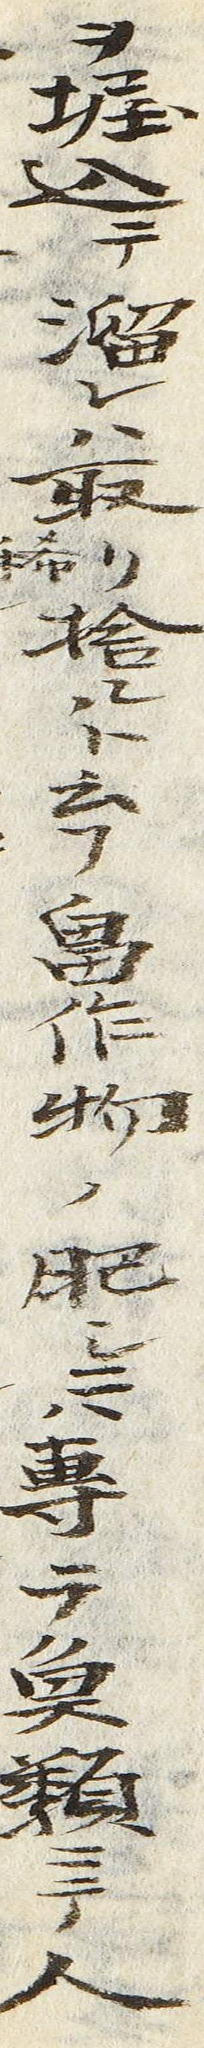ヲ掘込テ溜レハ取捨ルト云フ畠作物ノ肥シニハ専ラ魚類ニテ人
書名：漂流記聞
